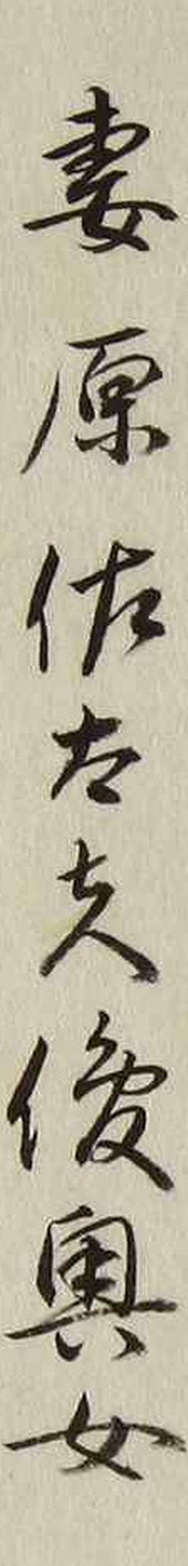妻原佐太夫俊奥女
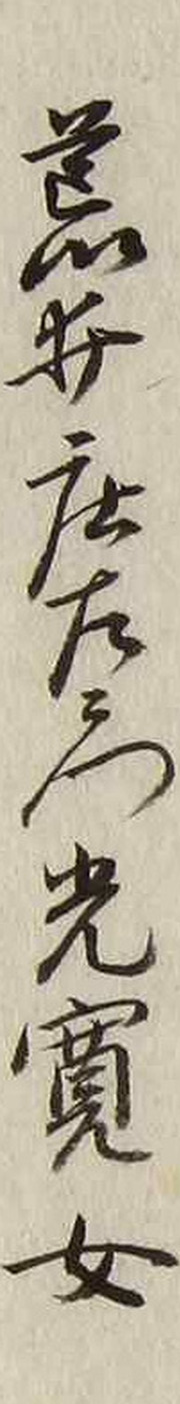荒井庄左衛門光寛女
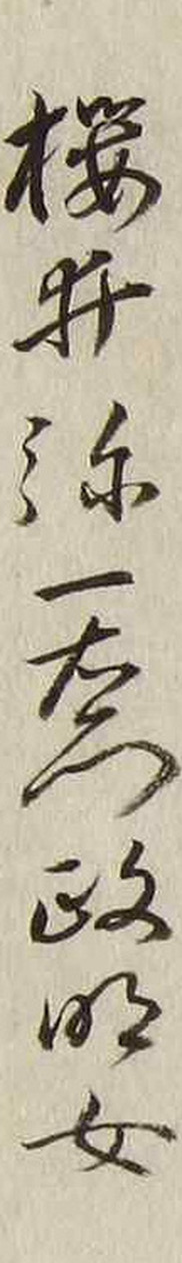桜井弥一右衛門政明女

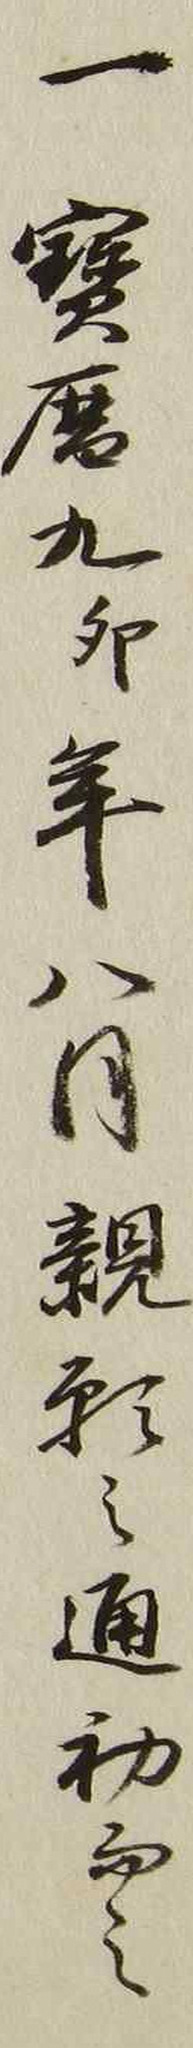一宝暦九卯年八月親願之通初而之
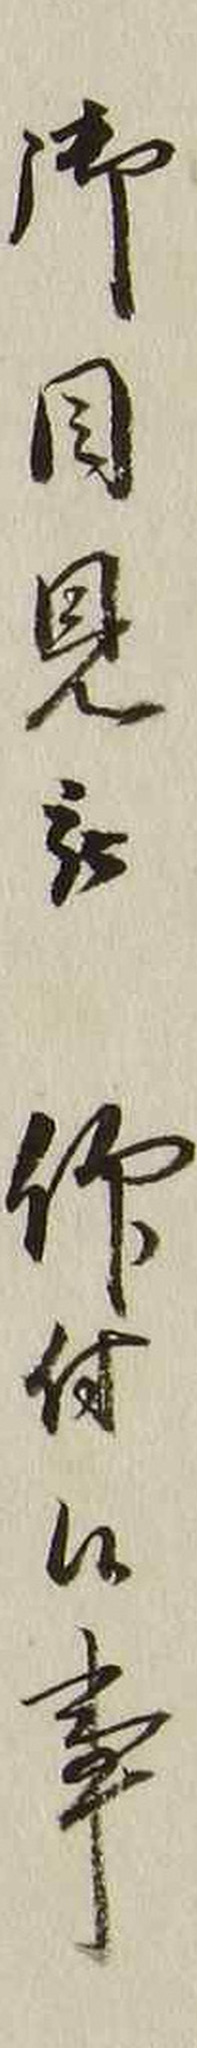御目見被仰付候事
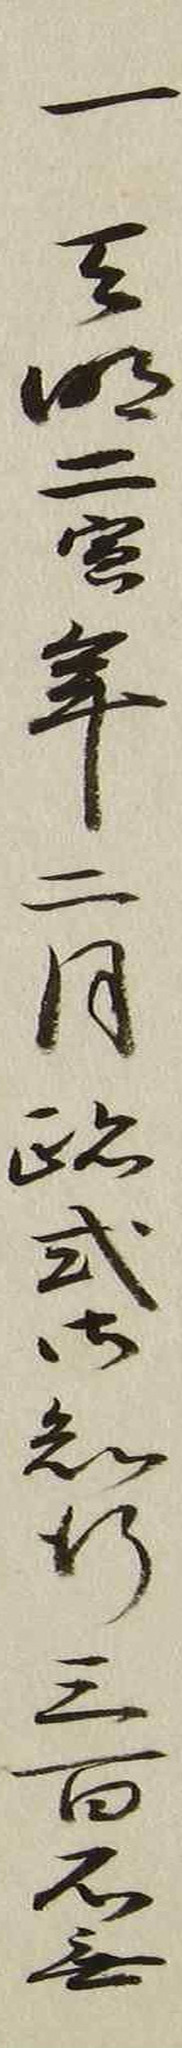一天明二寅年二月跡式御知行三百石無
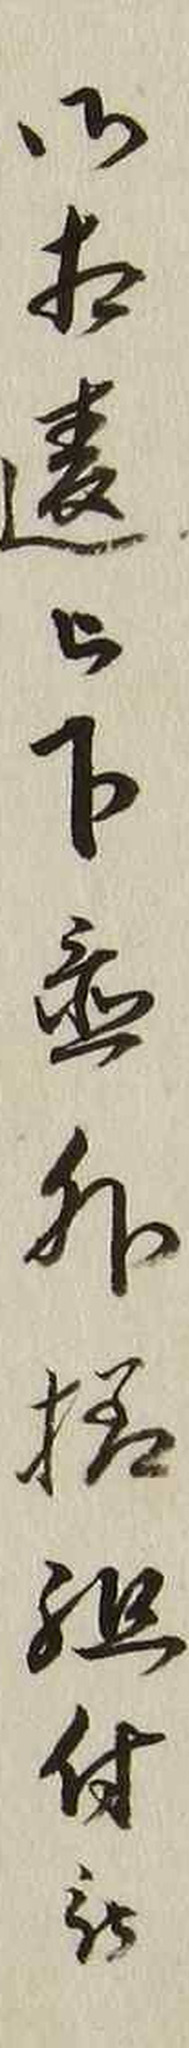御相違被下置外様組付被
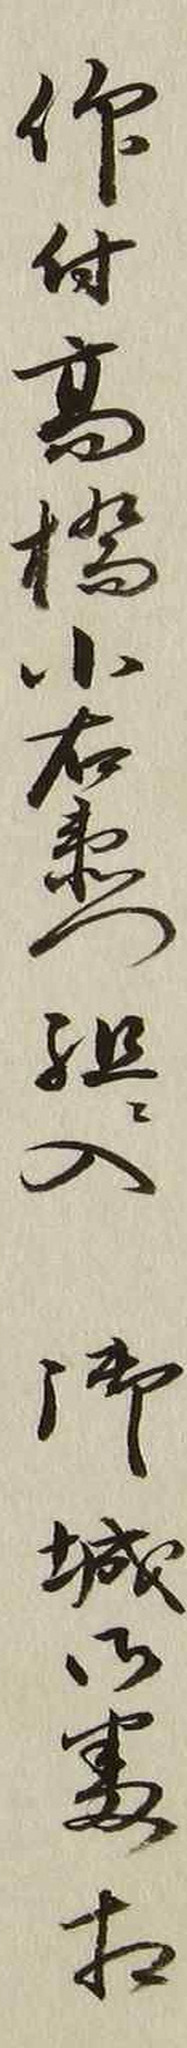仰付高橋小右衛門組ニ入御城御番相
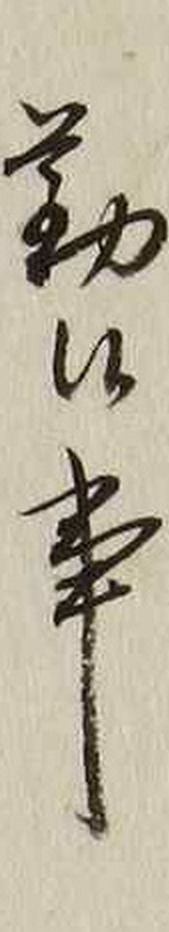勤候事
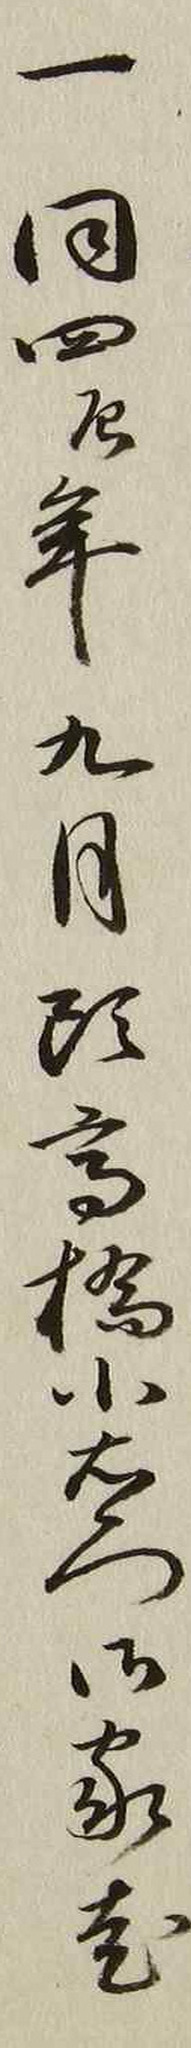一同四辰年九月頭高橋小右衛門御家老
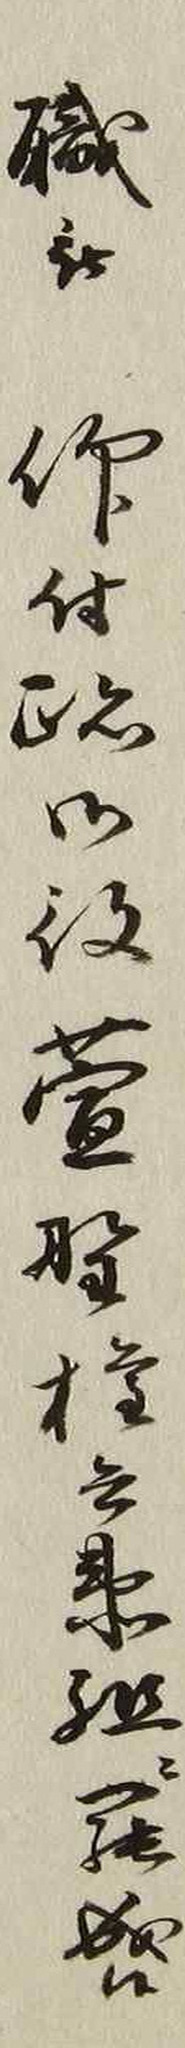職被仰付跡御役萱野権兵衛組ニ罷成候
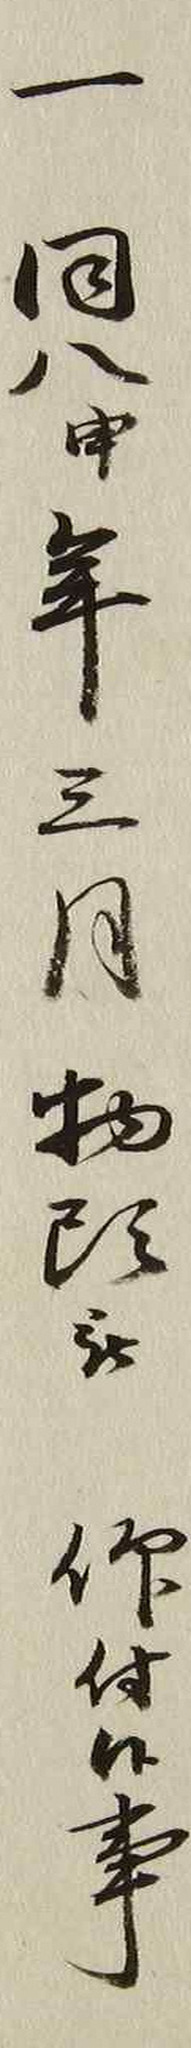一同八申年三月物頭被仰付候事
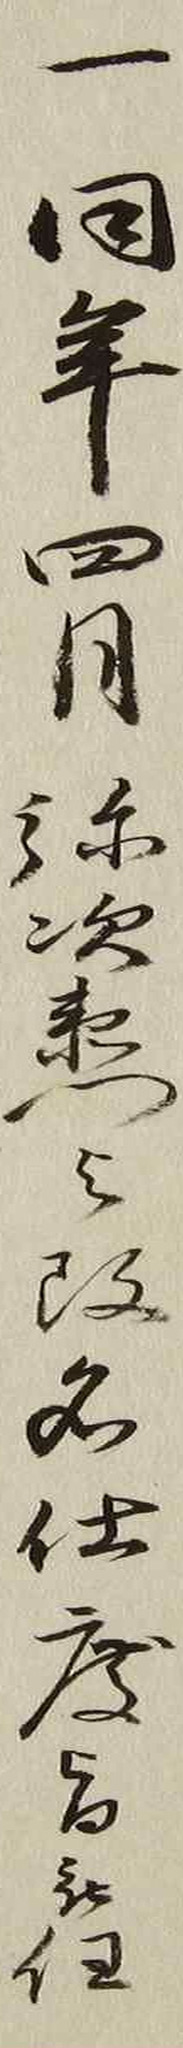一同年四月弥次衛門と改名仕度旨被任
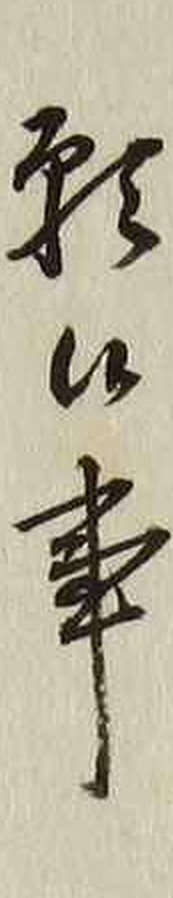願候事
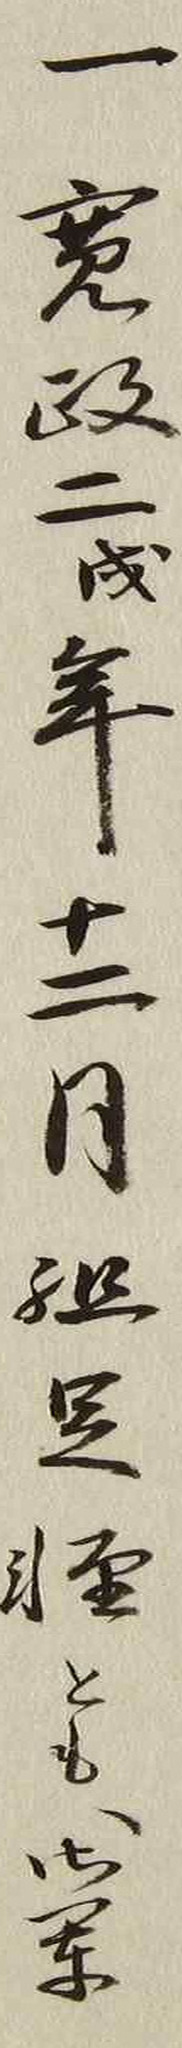一寛政二戌年十二月組足軽ともへ御闌
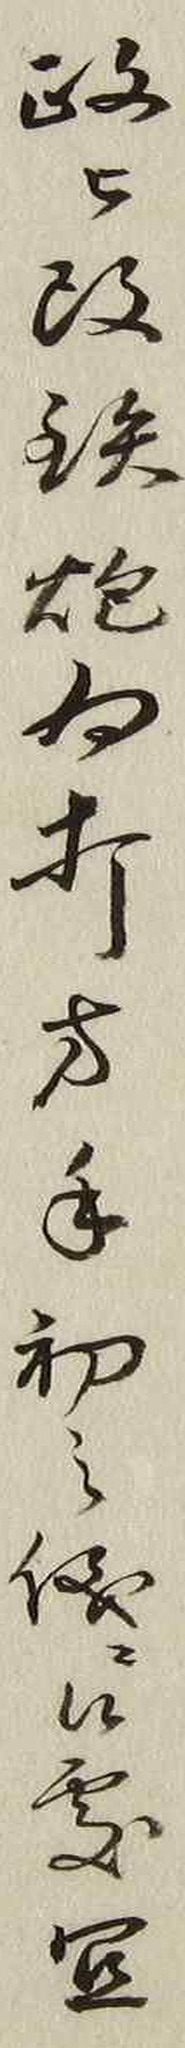政被改鉄砲為打方手初之儀ニ候処宜
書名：諸士系譜　巻之160　な之部2
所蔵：会津若松市立会津図書館
